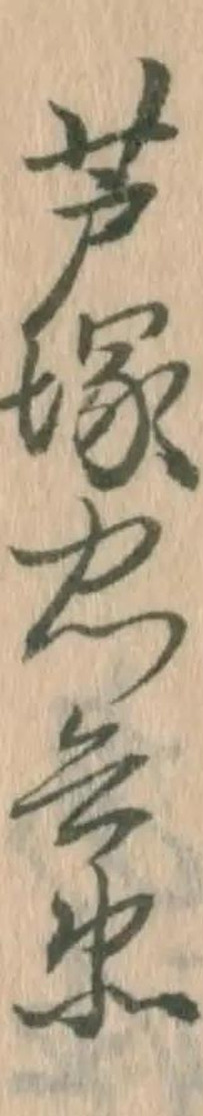芦塚忠兵衛
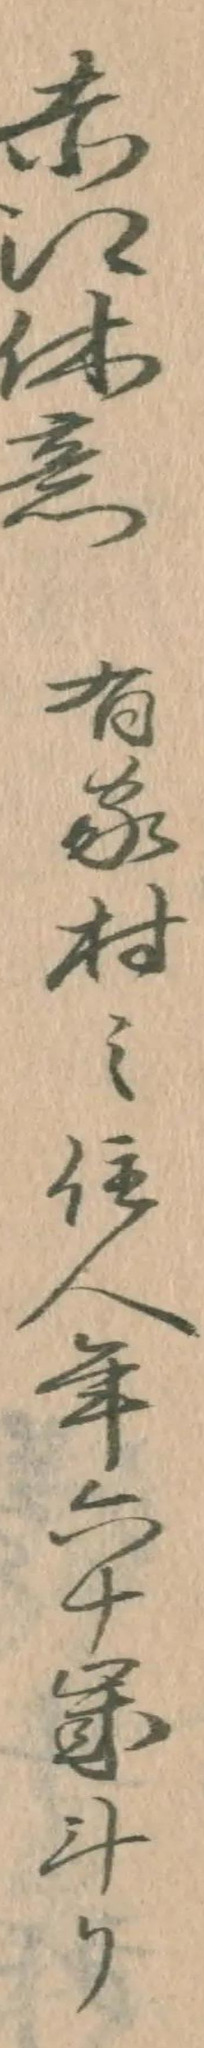赤江休意有家村之住人年六十歳斗り
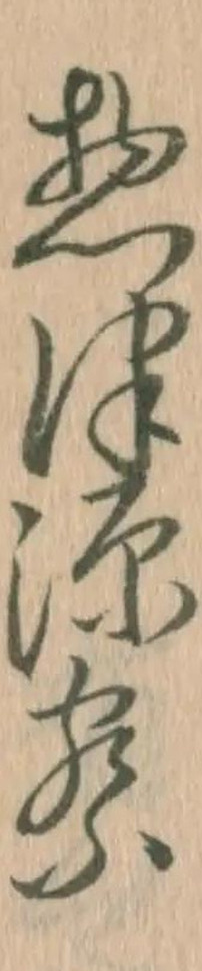惣津源察
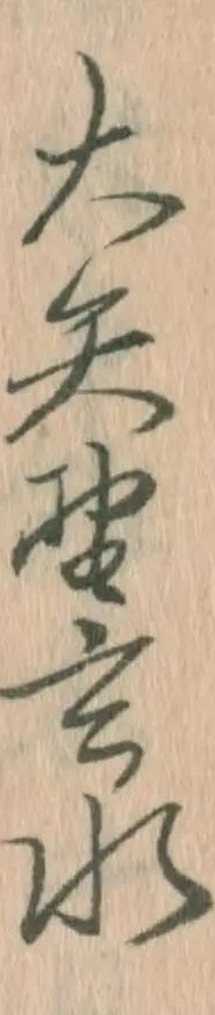大矢野玄水
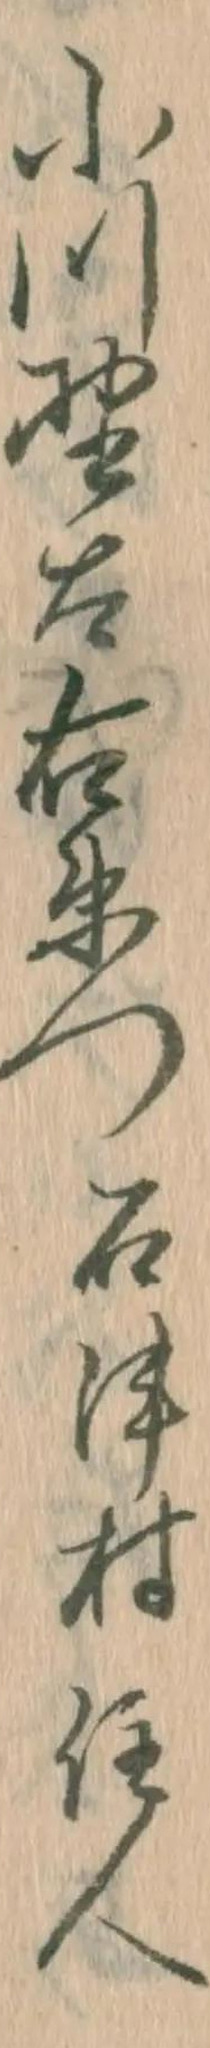小川野太右衛門石津村住人
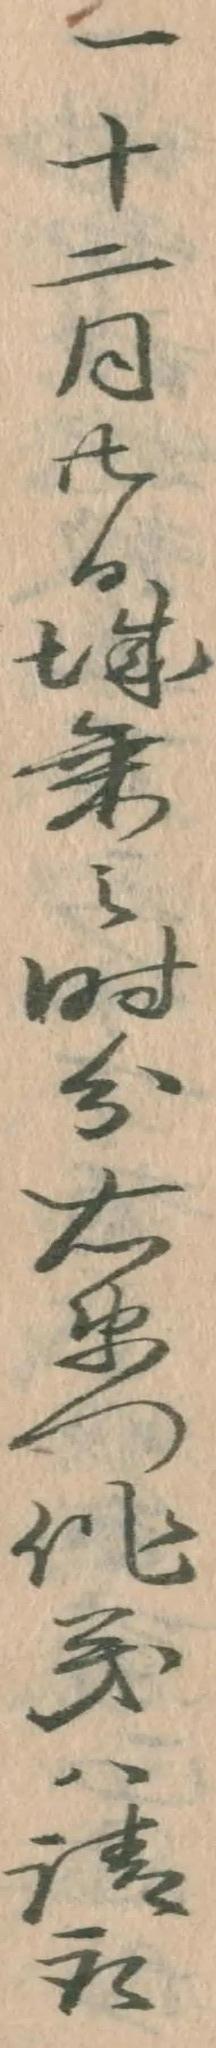一十二月廿日城乗之時分右衛門作義は請取
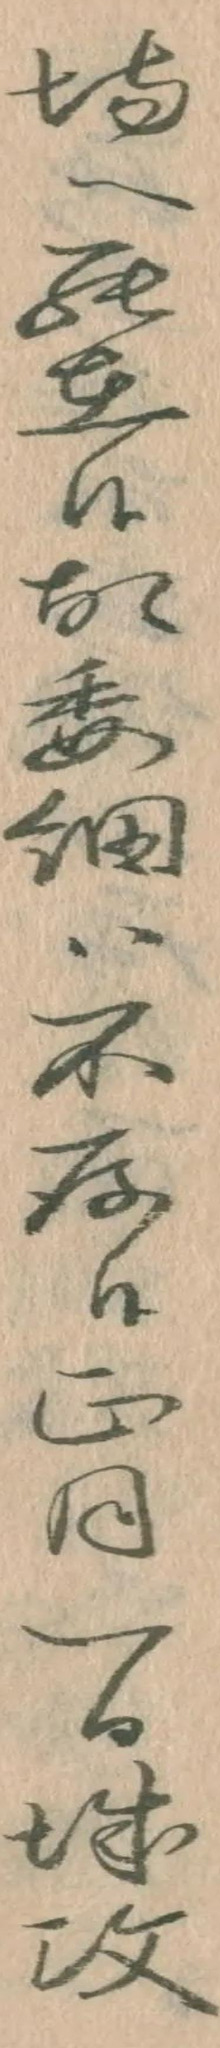場へ罷在候故委細は不存候正月一日城攻
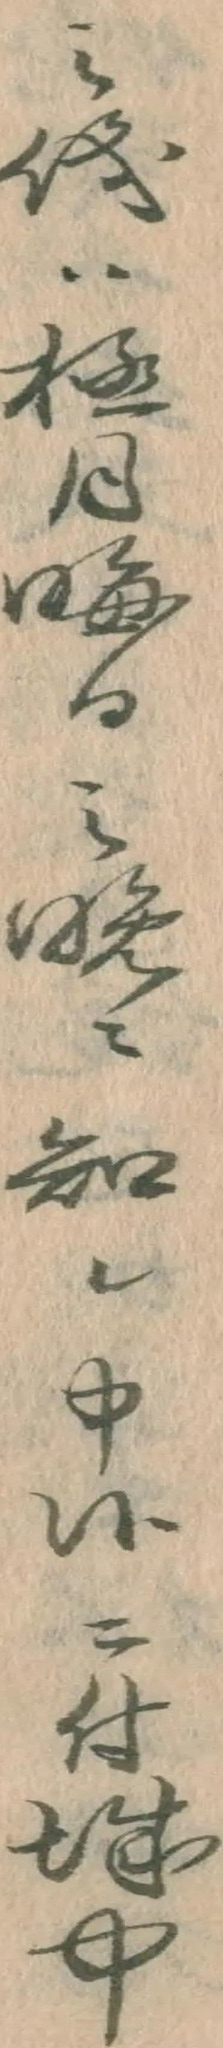之儀は極月晦日之晩に知れ申候に付城中
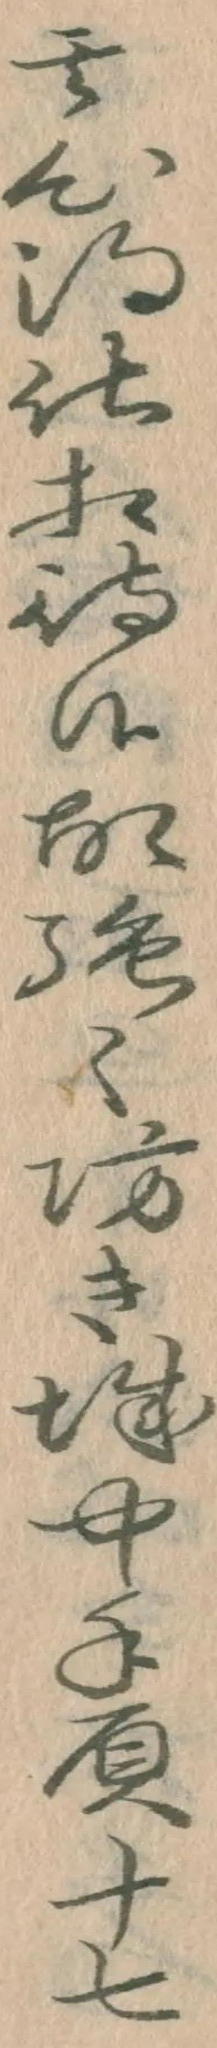其心得仕相待候故強く防き城中手負十七
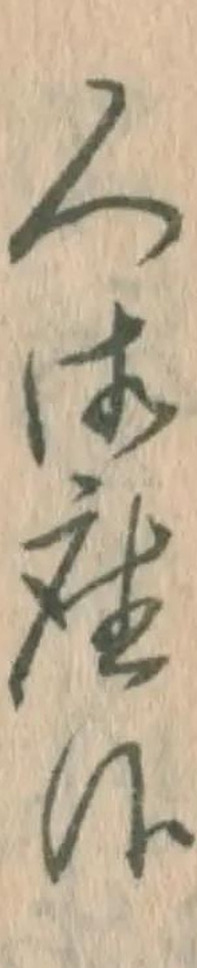人御座候
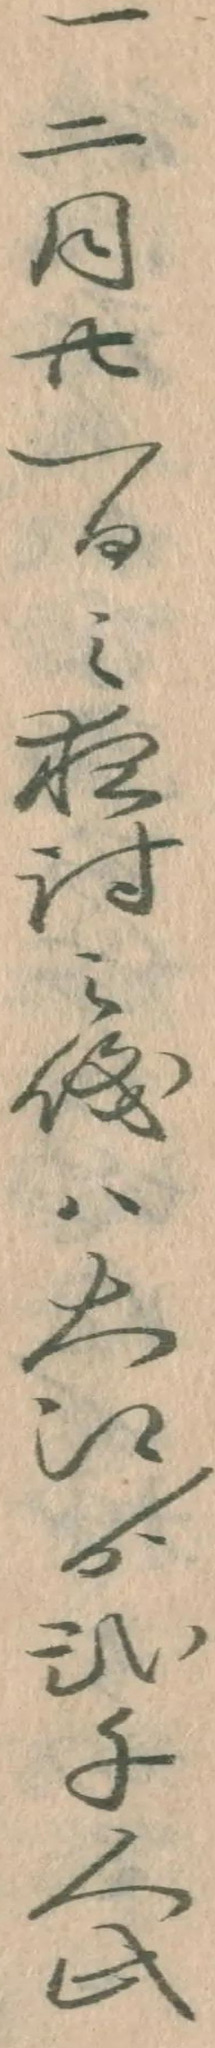一二月廿一日之夜討之儀は大江ゟ弐千人此
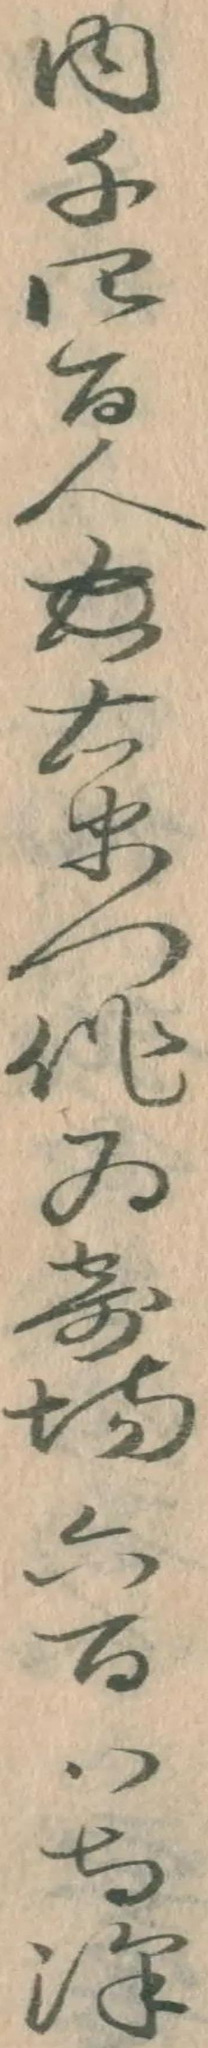内千四百人忠右衛門作ゐ寄場六百は寺沢
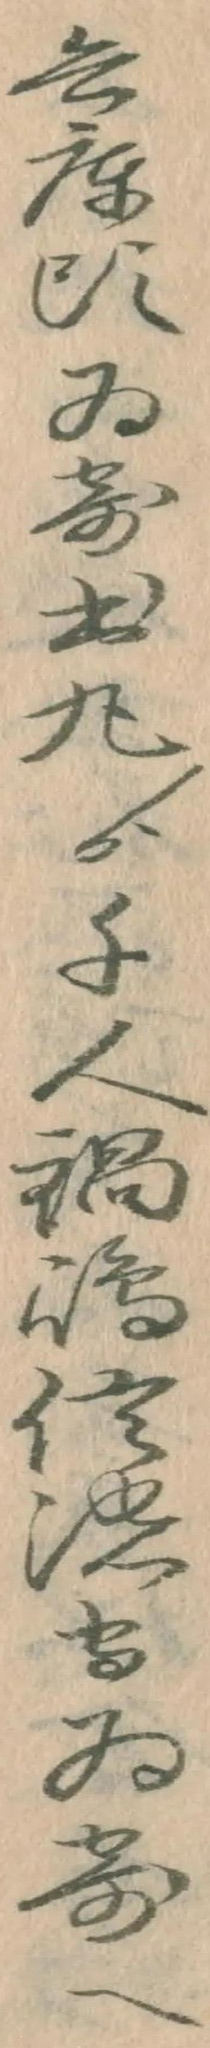兵庫頭ゐ寄出丸ゟ千人鍋島信綱守ゐ寄へ

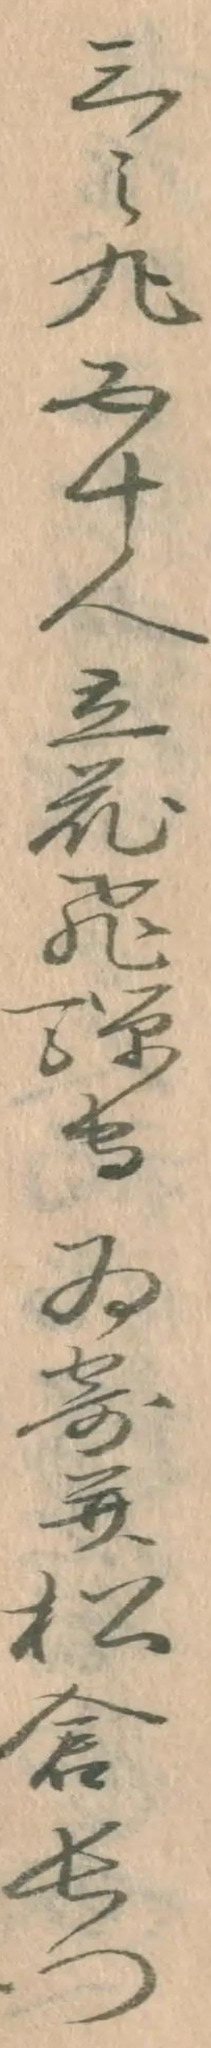三之丸五十人立花飛騨守ゐ寄幷松倉長門
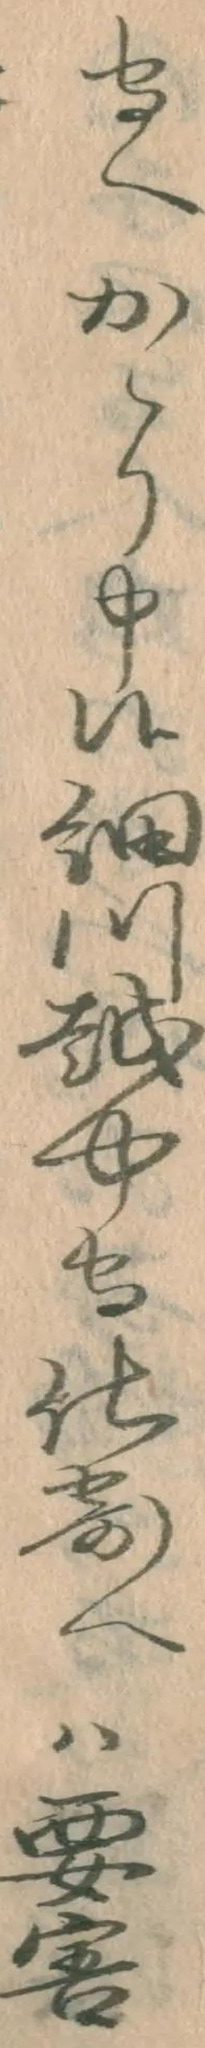守へかゝり申候細川越中守仕寄へは要害
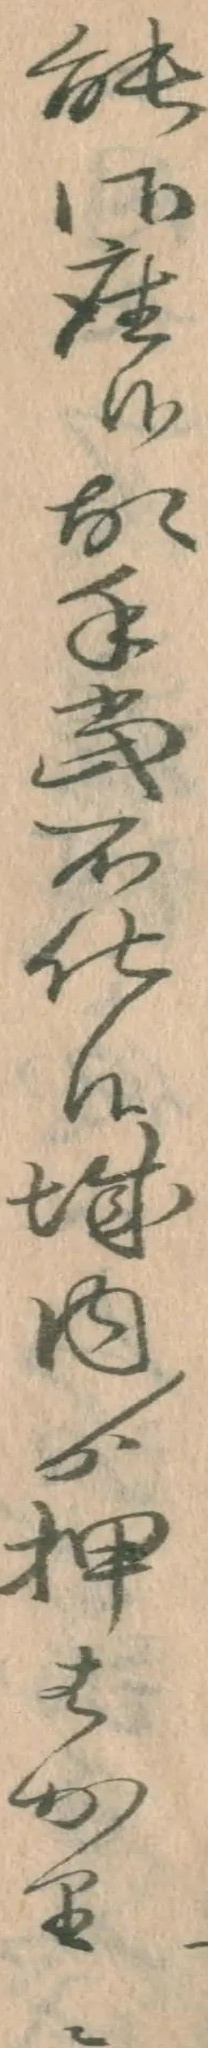能御座候故手当不仕候城内ゟ押者か里に
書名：切支丹御退治記 49巻. [9]
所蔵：国立国会図書館 National Diet Library, JAPAN
